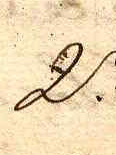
2.o
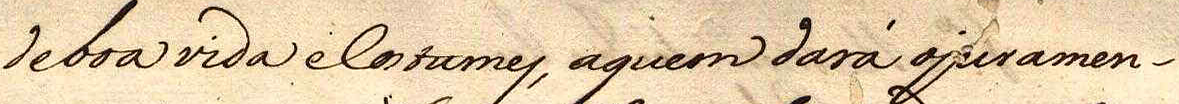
de boa vida e Costumes, a quem dará o juramen
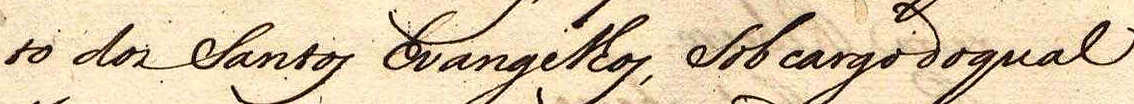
to doz Santos Evangelhos, Sobcargo do qual
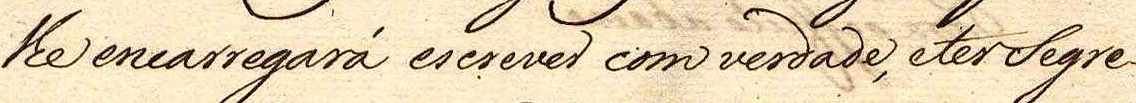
lhe encarregará escrever com verdade, e ter Segre
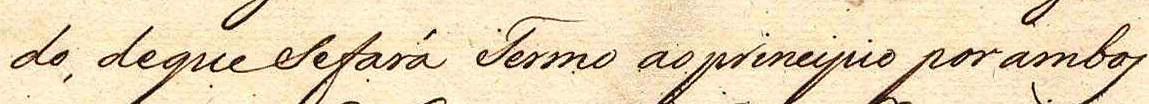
do, de que Se fará Termo ao principio por ambos
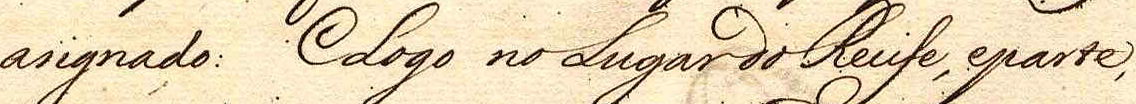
asignado: e Logo no Lugar do Recife, e parte,
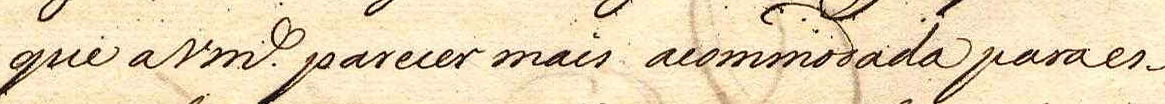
que a vm.e parecer mais acommodada para es
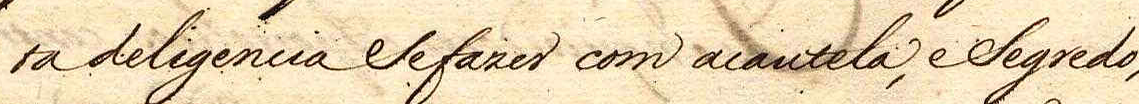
ta deligencia Se fazer com a cautela, e Segredo,
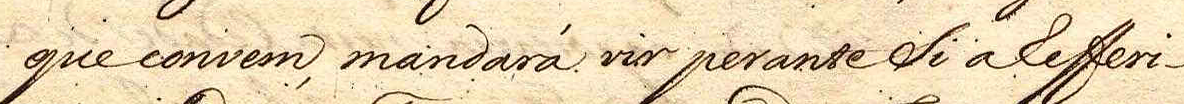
que convem, mandará vir perante Si a Refferi
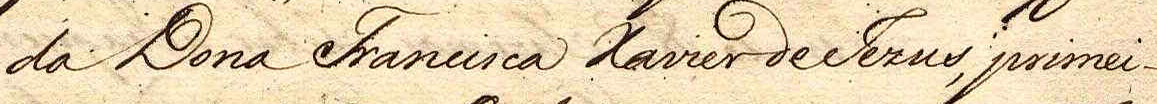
da Dona Francisca Xavier de Iezus, primei
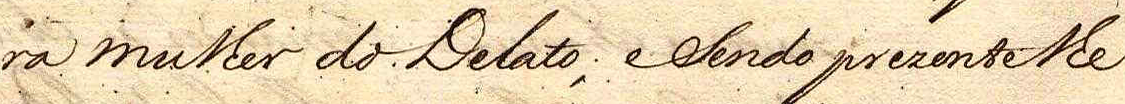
ra mulher do Delato; e Sendo prezente lhe
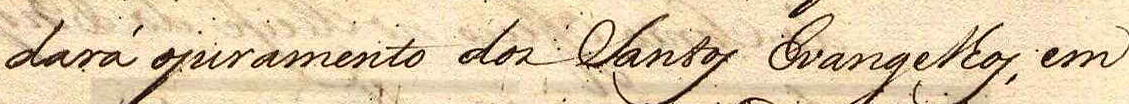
dará o juramento doz Santos Evangelhos, em
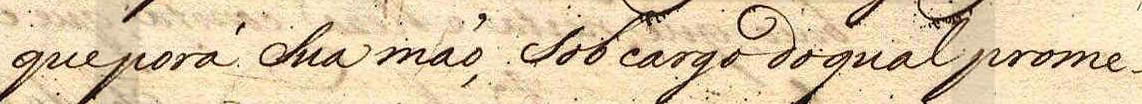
que porá Sua maõ, Sobcargo do qual prome
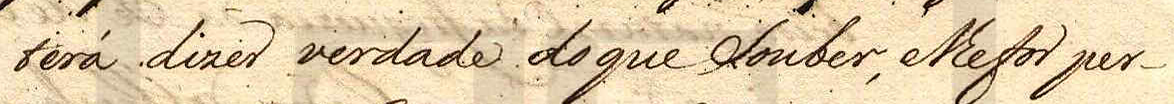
terá dizer verdade do que Souber, e lhe for per
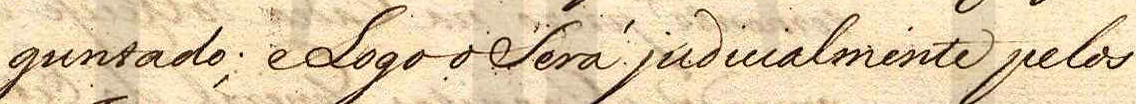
guntado, e Logo o Será judicialmente pelos
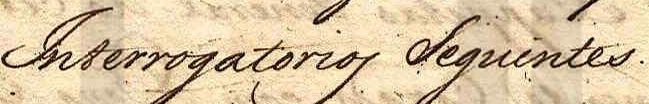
Interrogatorios Seguintes.
